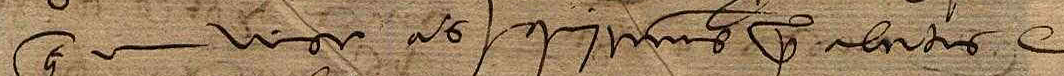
q̄ ouvese as Jnqujrições p̄o abertas e
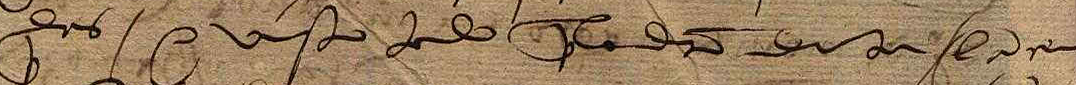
pdas / e visto todo p̄lo dito doutor / lāçou
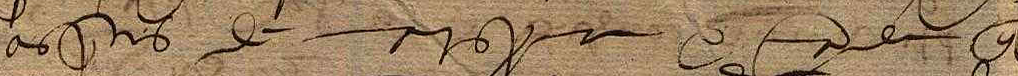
as p̄tes de majs ꝓua e mādou q̄
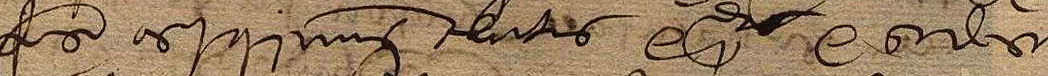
fosē as Jnqujrições abertas e p̄das e se dese
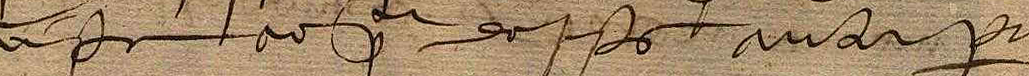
vista ao p̄tor da Justa autor ꝑa
